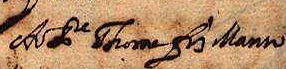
Ao P.e Thome frz̄ Manso
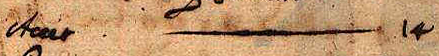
Aceit. - 14
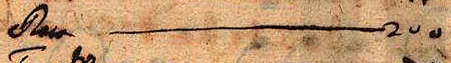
Rasa - 200
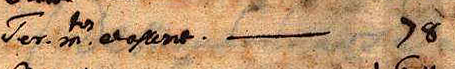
Ter. mtos. e assent. ‒ 78
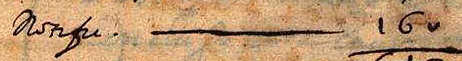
Notific. ‒ 160
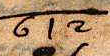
612
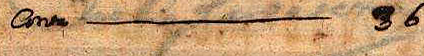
Conta - 36
